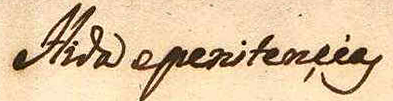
Hida e penitencias
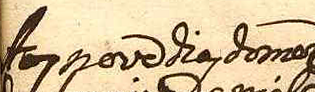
Aos nove dias do mes
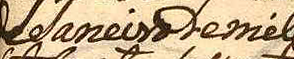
e Ianeiro de mil
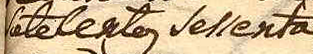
seteCentos sessenta
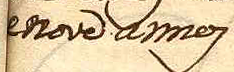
e nove annos
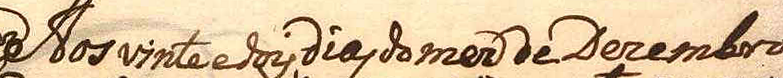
Aos vinte e dois dias do mez de Dezembro
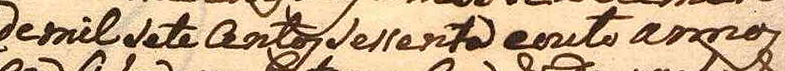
de mil seteCentos sessenta e outo annos
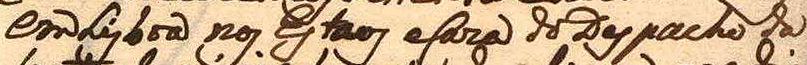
em Lisboa nos Estaos e Caza do Despacho da
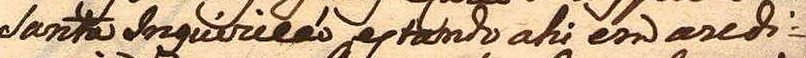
Santa Inquiziçaõ estando ahi em audi
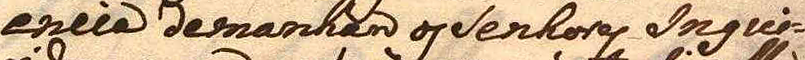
encia de manhan os senhores Inqui
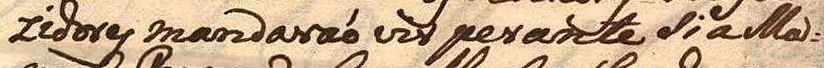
zidores mandarõ vir perante si a Ma
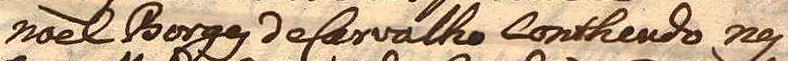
noel Borges de Carvalho contheudo nes
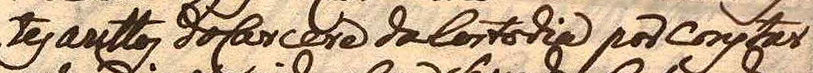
tes auttos do Carcere da Costodia por constar
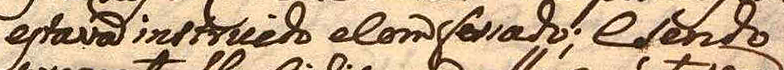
estava instruido, e Comfessado; e sendo
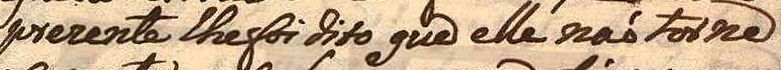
prezente lhe foi dito que elle naõ torne
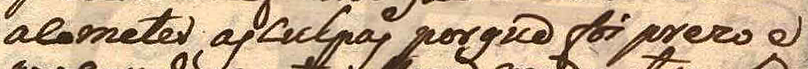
a cometer as culpas porque foi prezo, e
